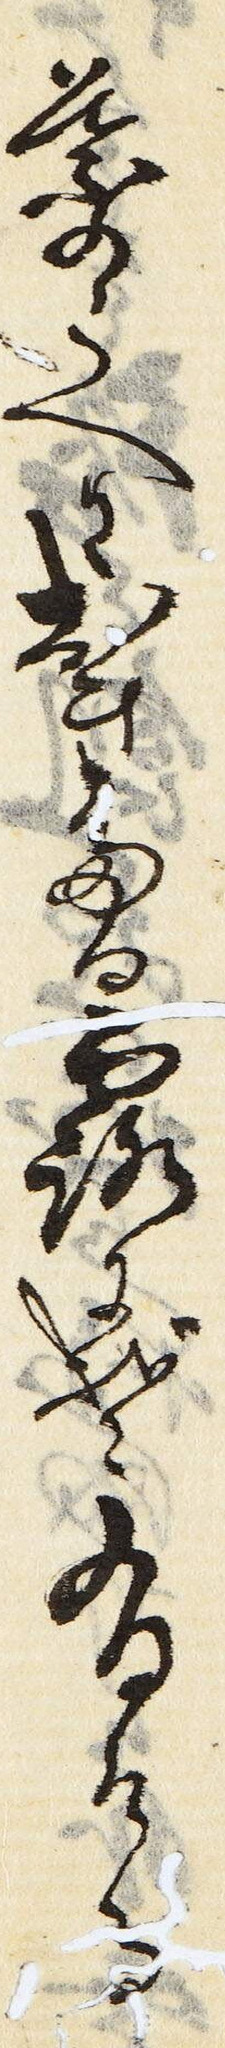葉のうへに置たる露にぞ有ける
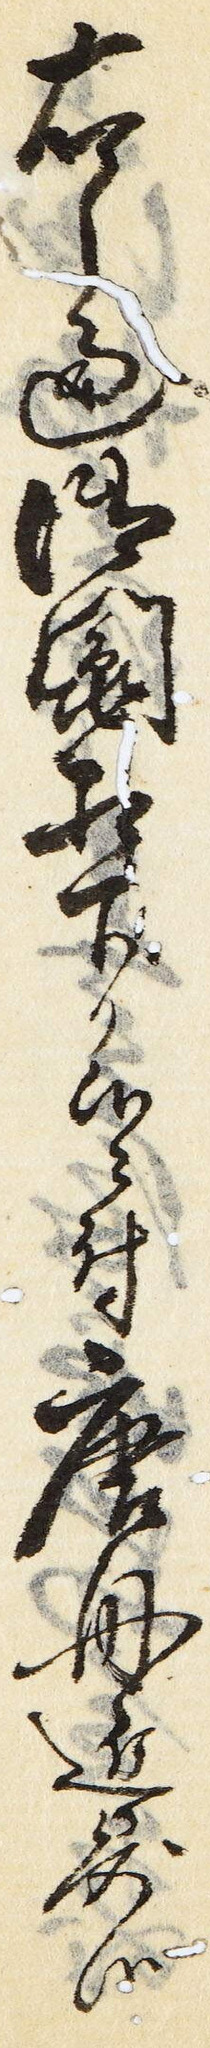右之通御鬮打下り候ニ付唐舟近寄候
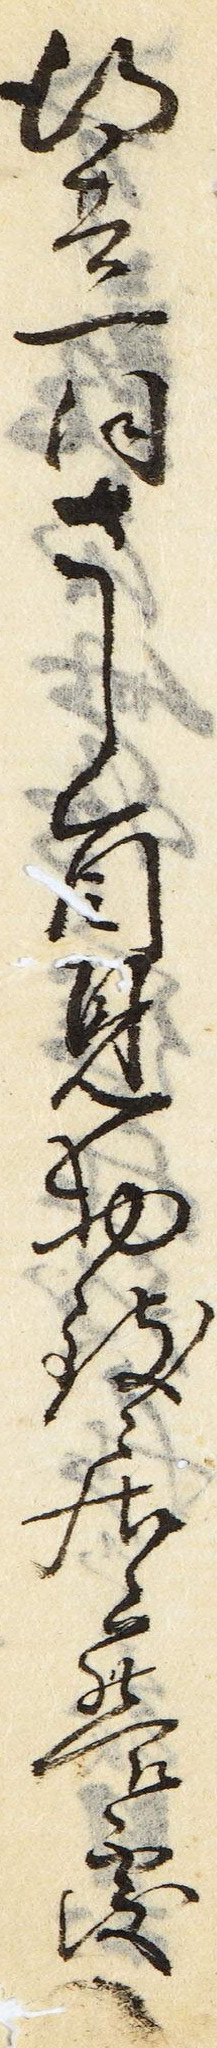得共一同さし首見物致居候然ル処
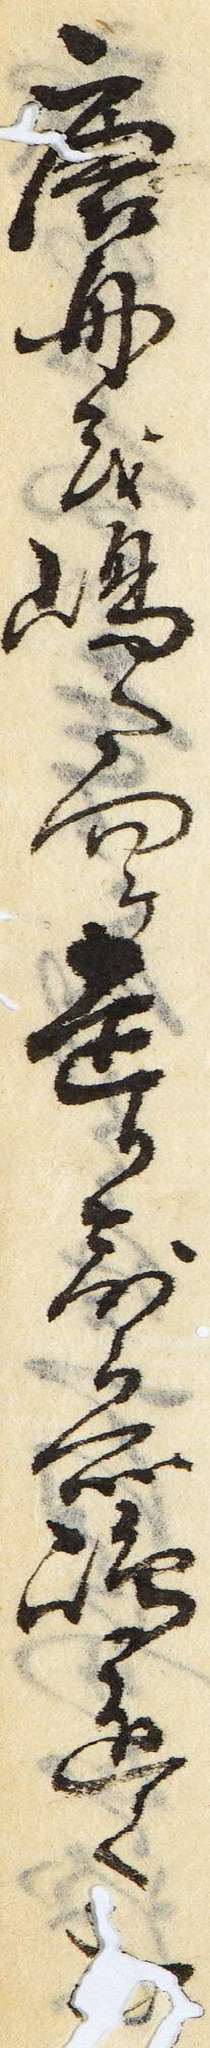唐舟も嶋へ向ケ走り寄候所嶋近く

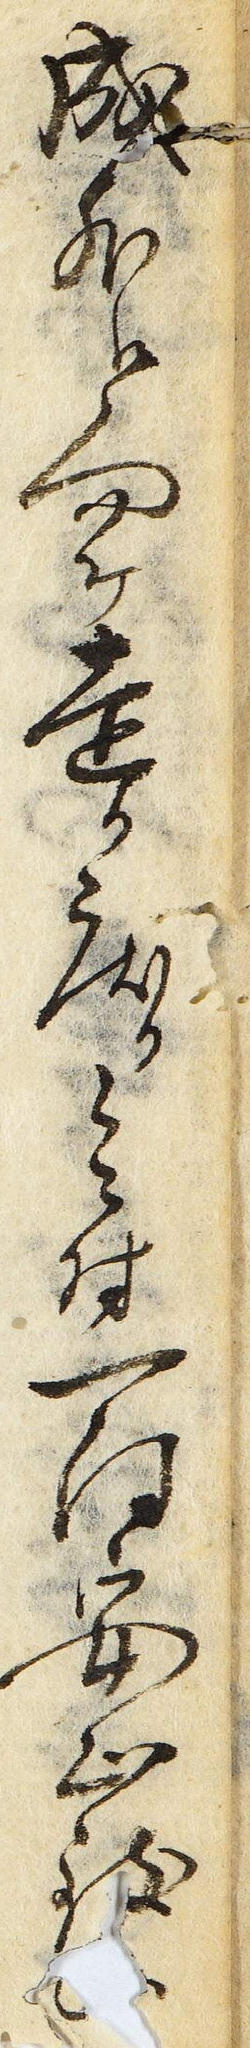成外え向ケ走り戻り候ニ付一同安心致候
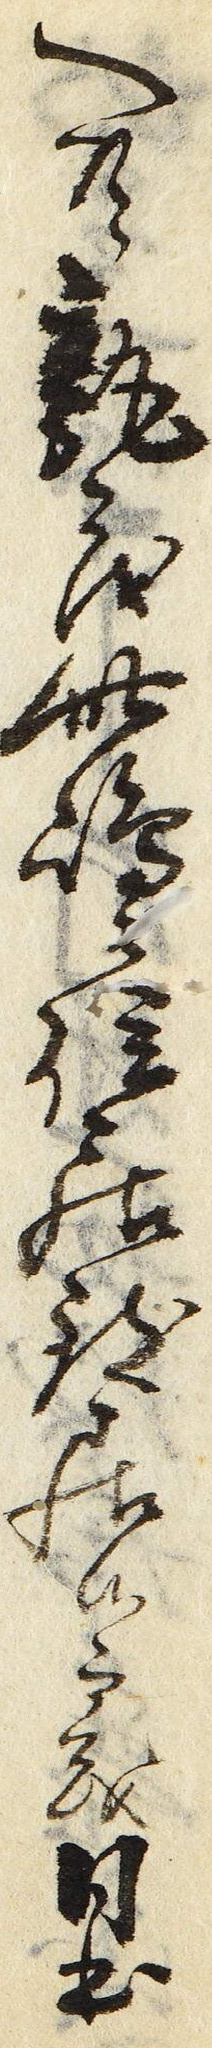へ共孰も此嶋ニ住居致居候而も日本
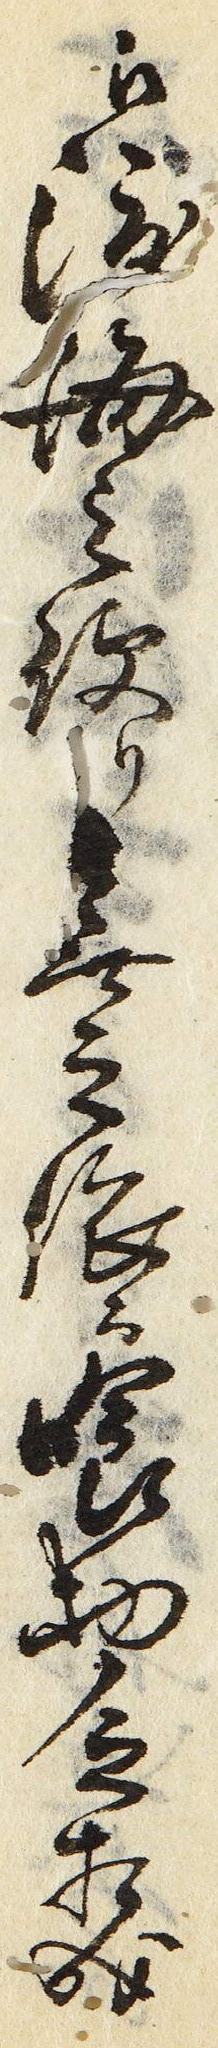えハ渡海之便り無之依而喰物乏相成
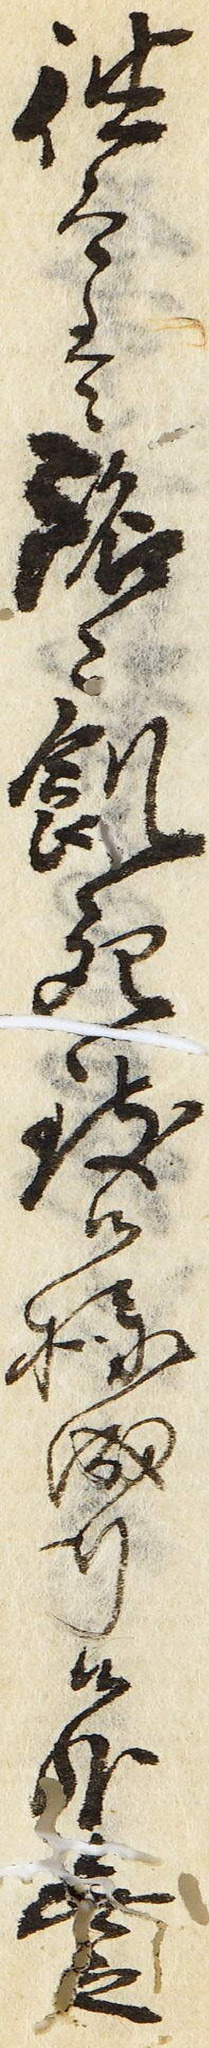往々は銘々飢死致候様成行候外無之
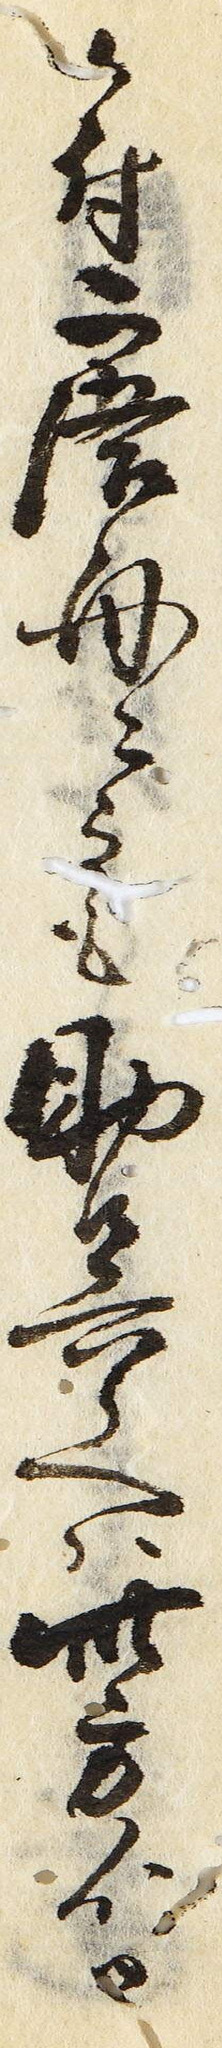ニ付唐舟ニ而も助呉候ヘハ此方ゟ
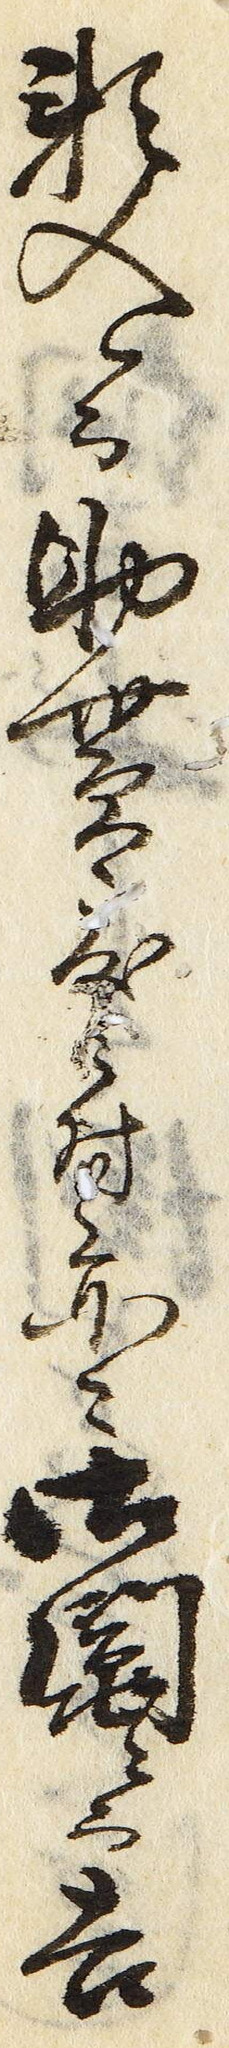頼入候而助貰候度ニ付亦々御鬮ニ而吉
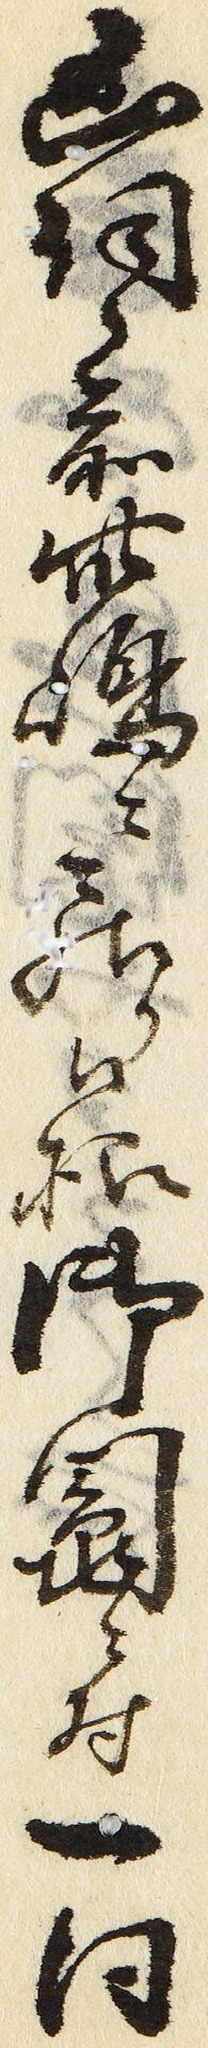凶伺候所此嶋ニ居り候様御鬮ニ付一同
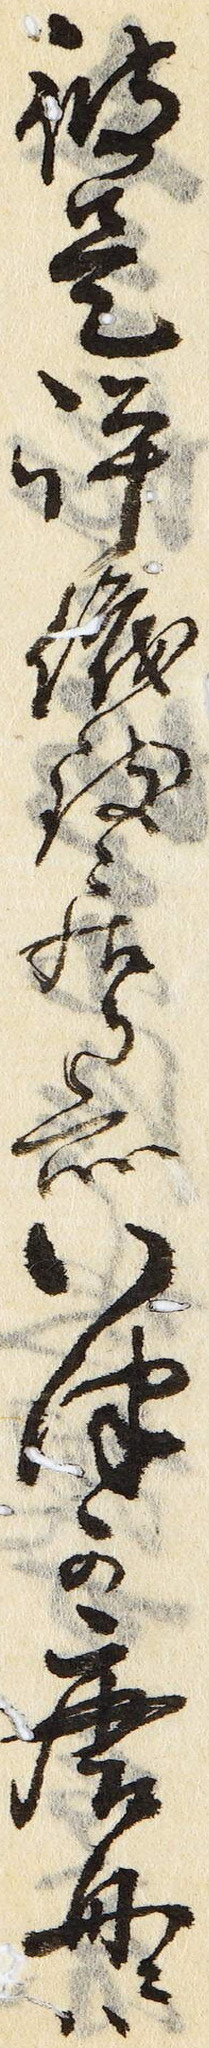彼是評儀致居候所いつか唐舟ニハ
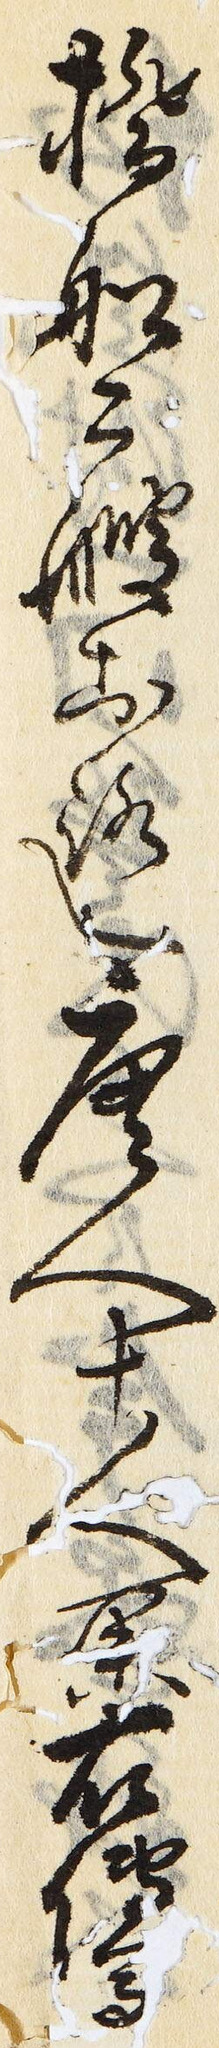橋船二艘おろし唐人十人余右伝馬
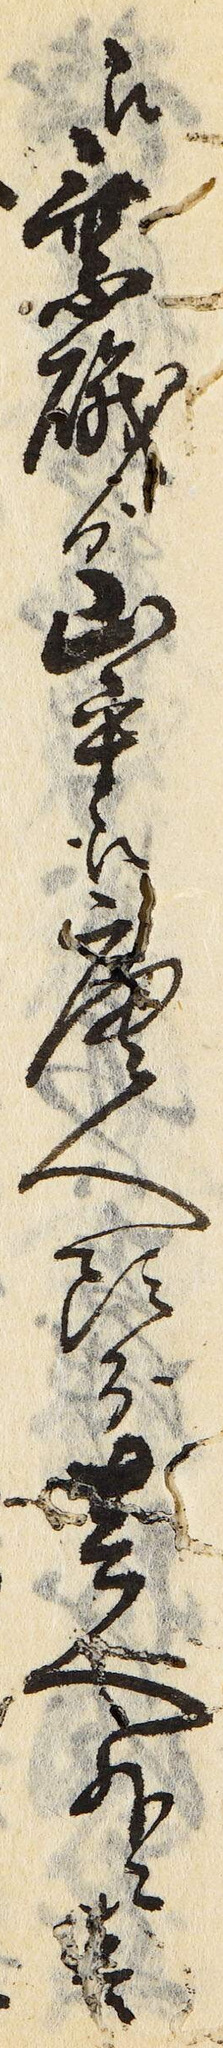え乗磯ゟ山手江唐人頭分壱人外ニ
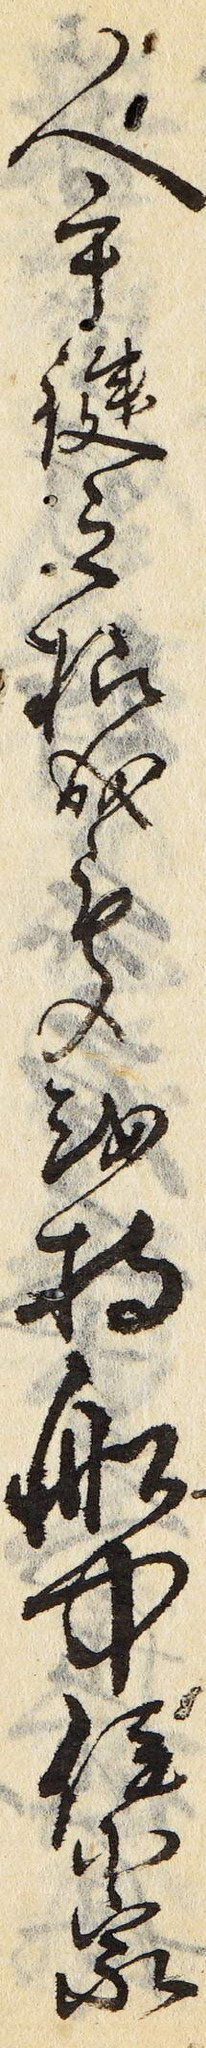人手鍵之様成ものを持船中住小家
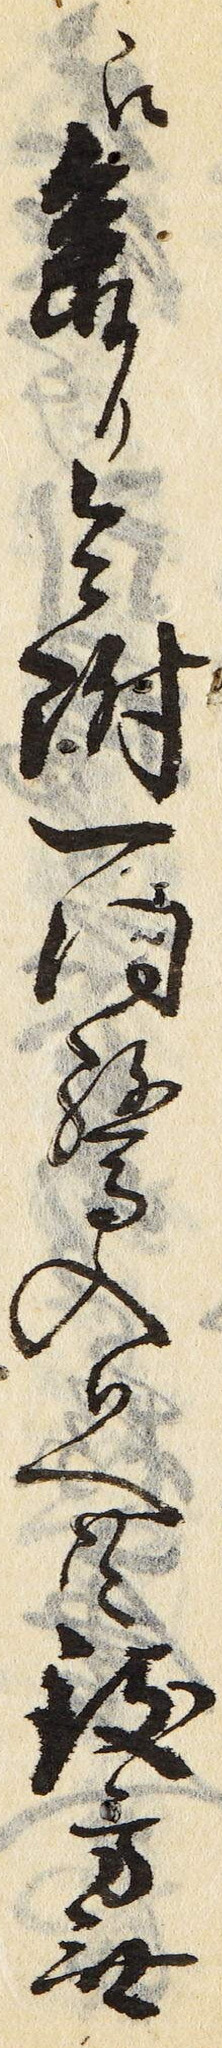え参り候ニ付一同驚入候へ共致方無
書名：阿波幸宝丸漂流記
